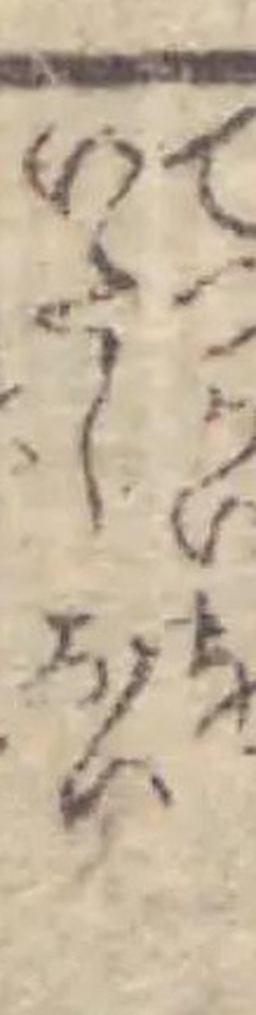いたしおい
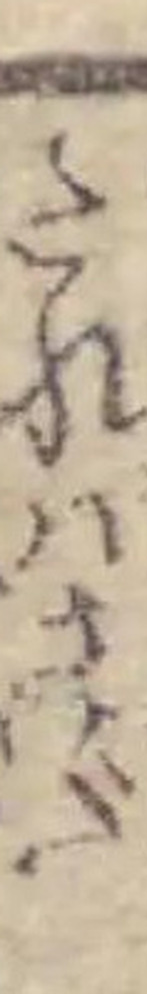たればさだ
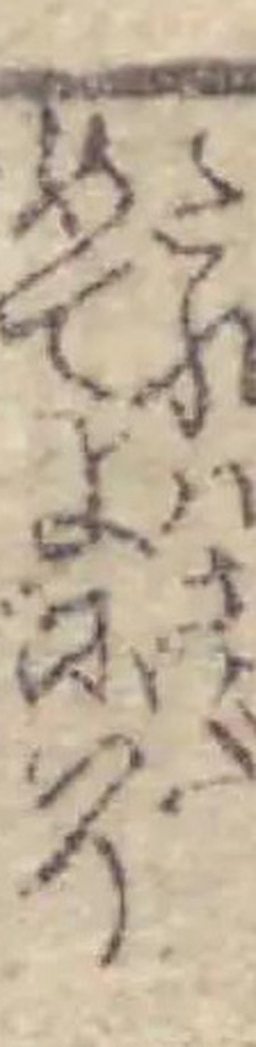めてよにいり
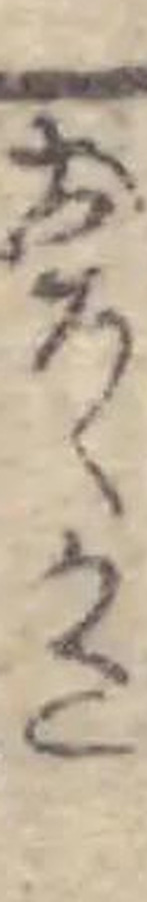おろくかた
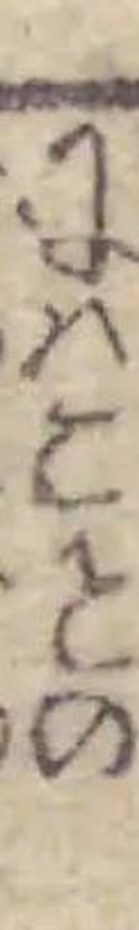にはことの
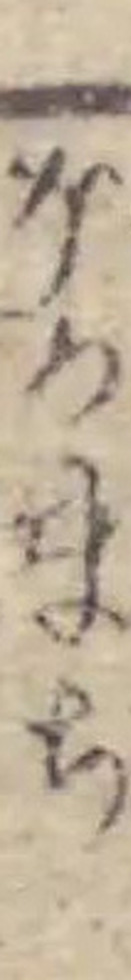ほかまち
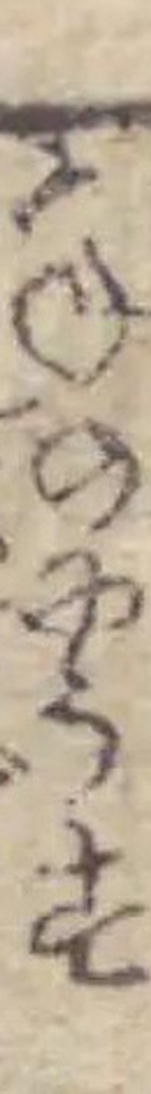かねのやうす
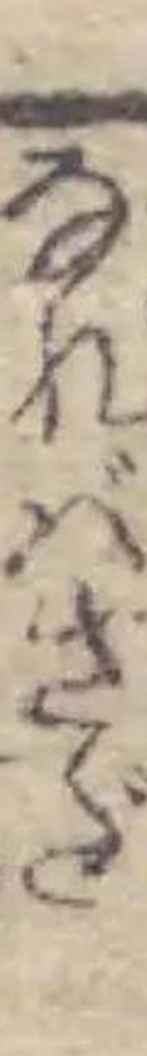なればさだ
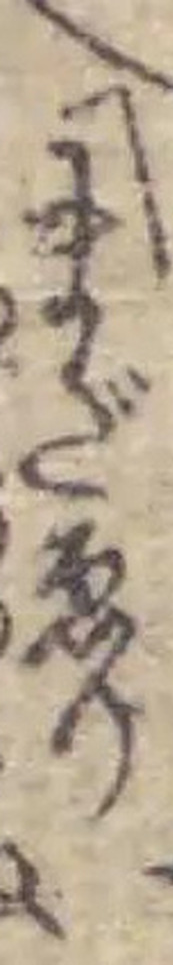〽まだゑり
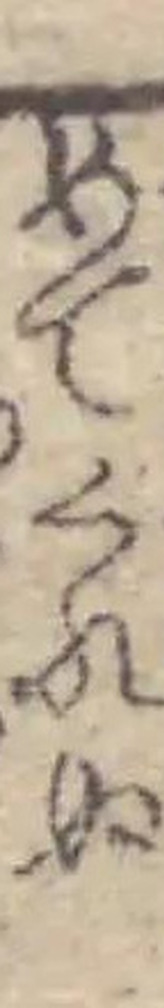めてくれぬ
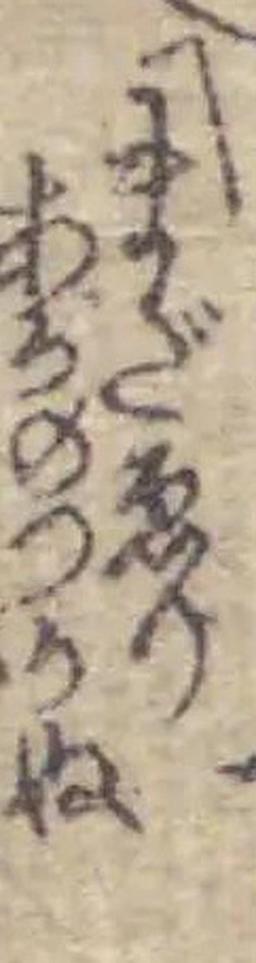あかのつかぬ
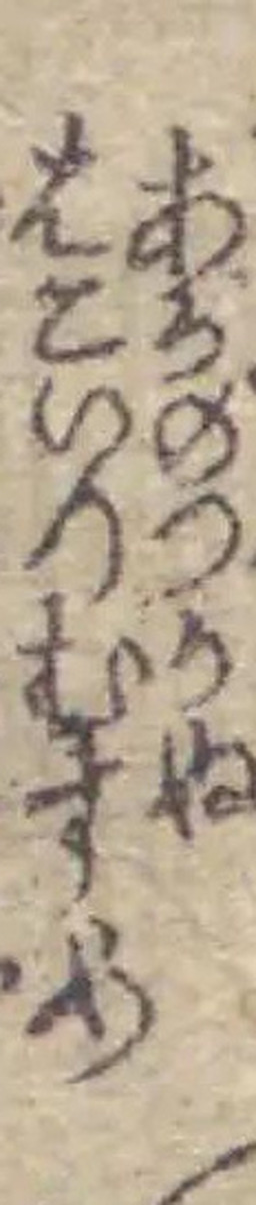はこいりむすめ
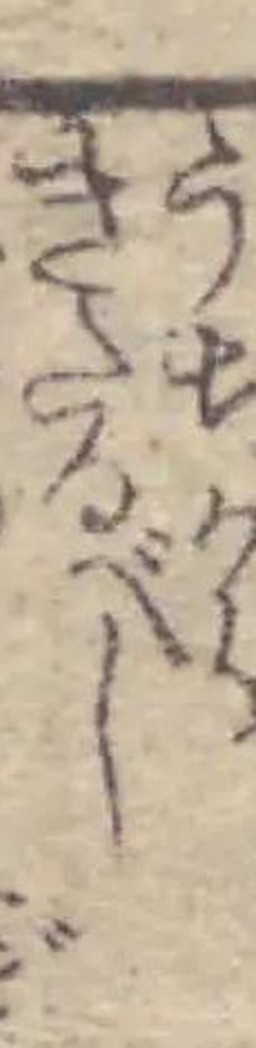きたるべし
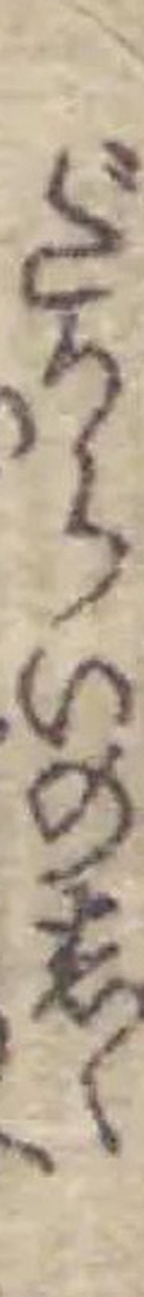だからいのしゝ
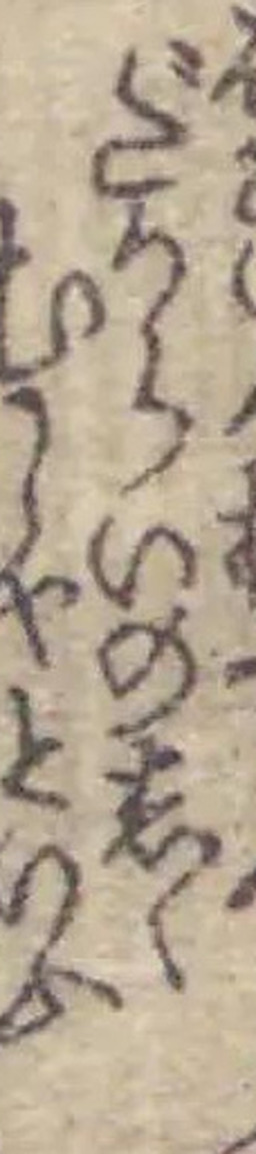むしやといふ
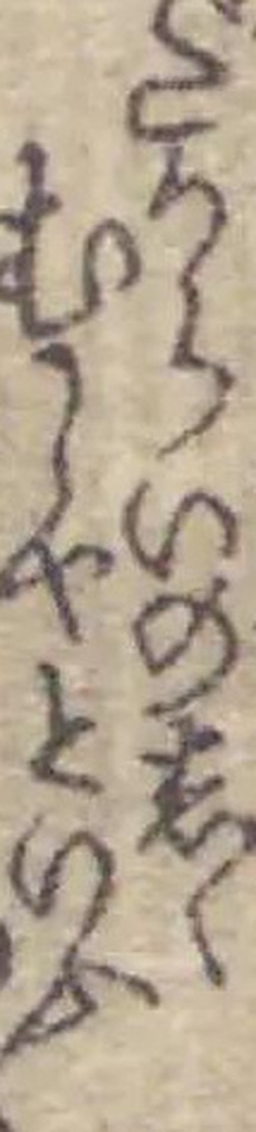むしやといふ
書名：化物尽 4巻
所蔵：国立国会図書館 National Diet Library, JAPAN
